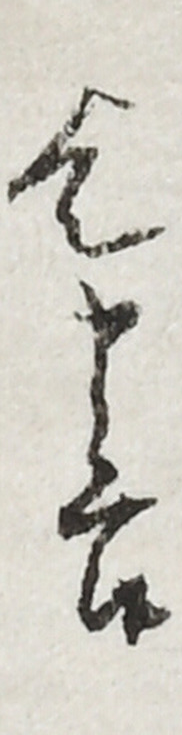乞申上候
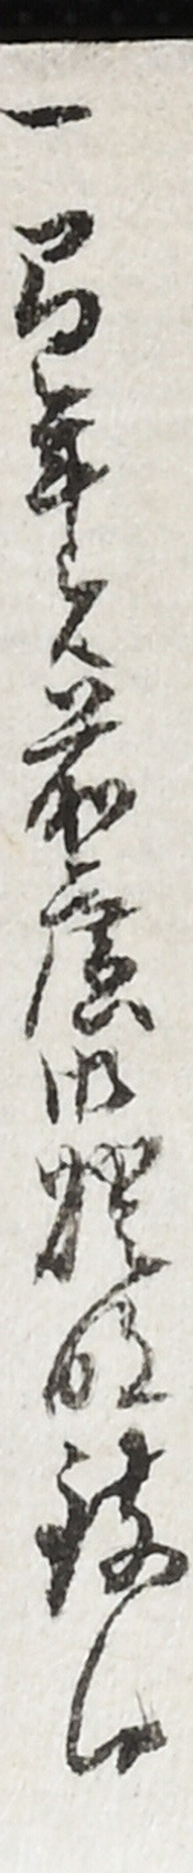一石堂は前広御燈明致候
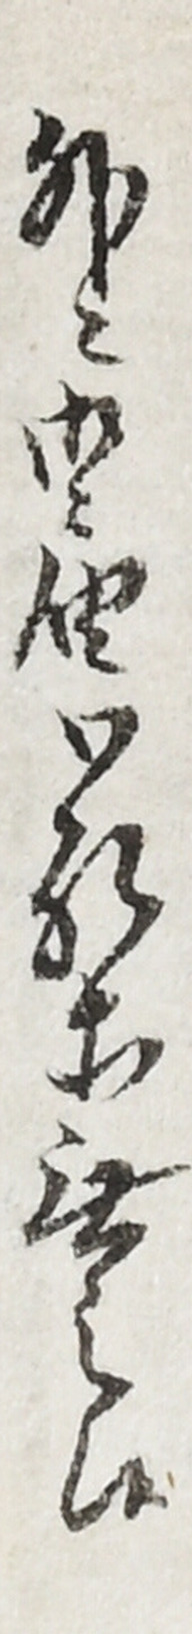外ニ御届御礼等無之候
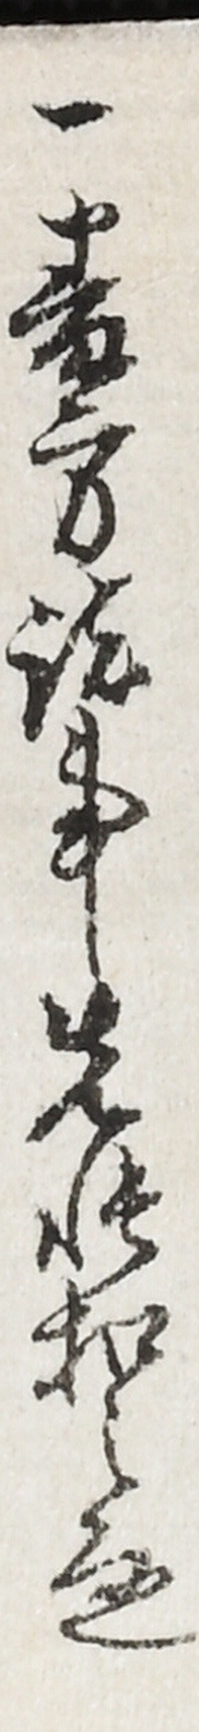一番方諸事先帳扣之通
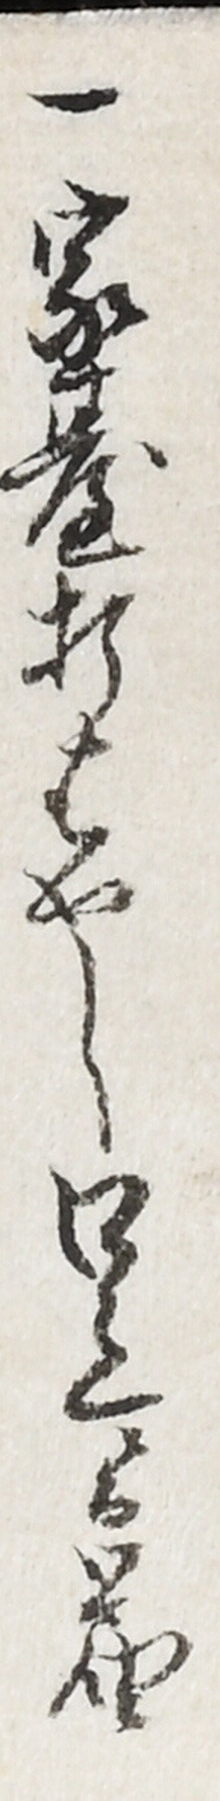一家台折はやし口迄ニ而御届
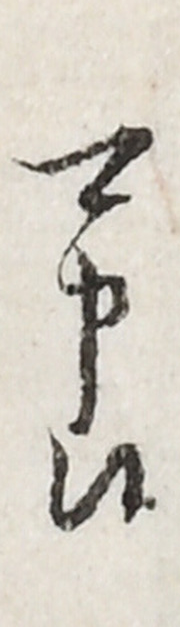可申候
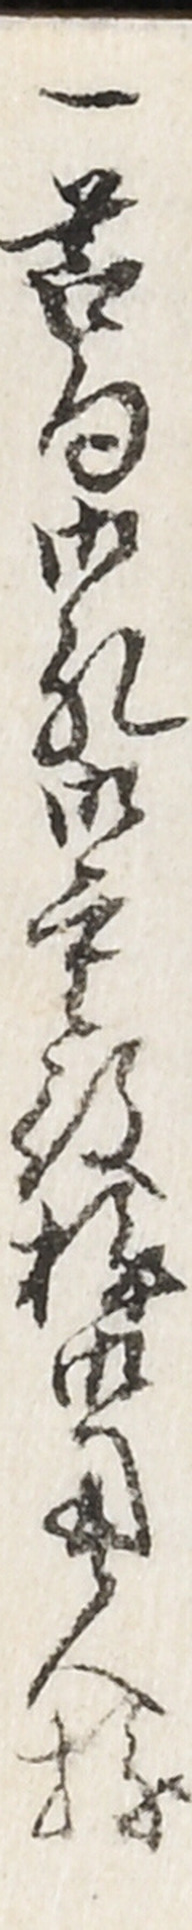一節句御礼御重役様御用人様
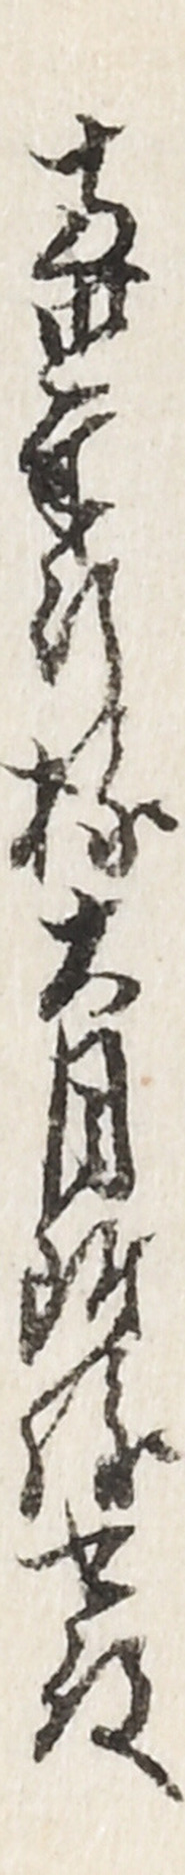南御奉行様大目付せ役
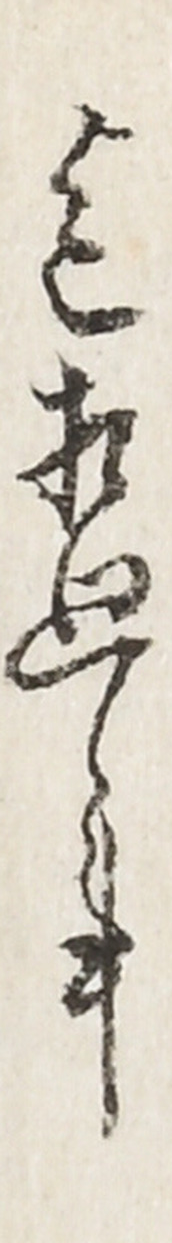迄相廻候事
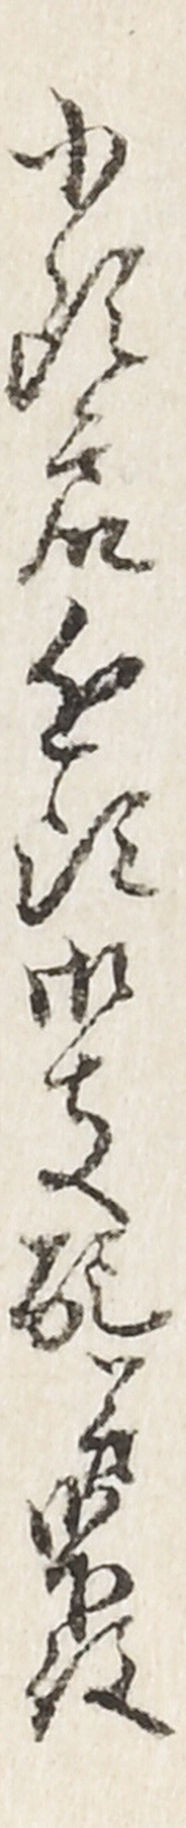小頭衆近頭御支配并御下役
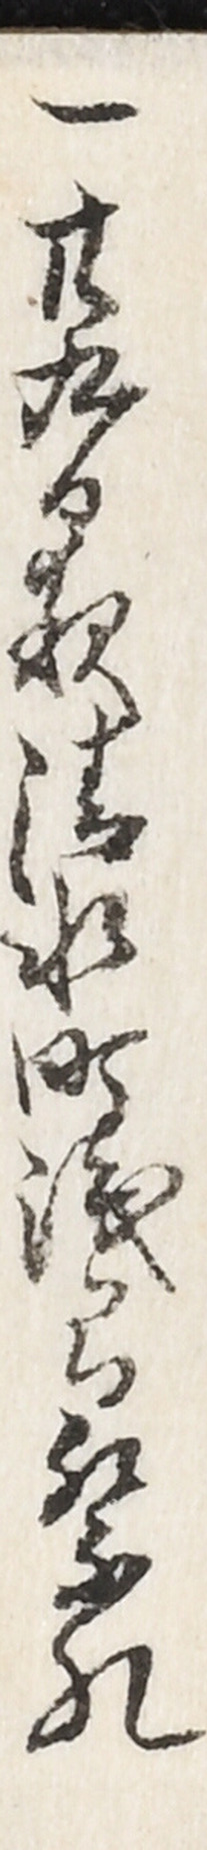一廿九日夜清水町浅間祭礼
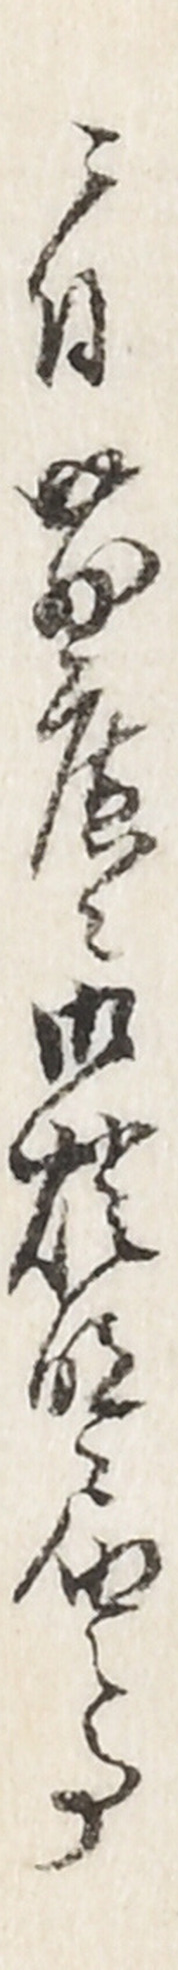ニ付前広ニ御燈明届候事

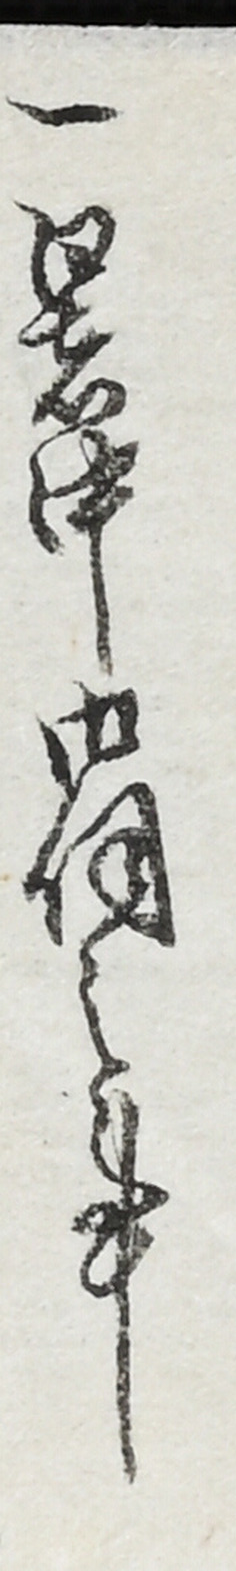一暑中御伺之事
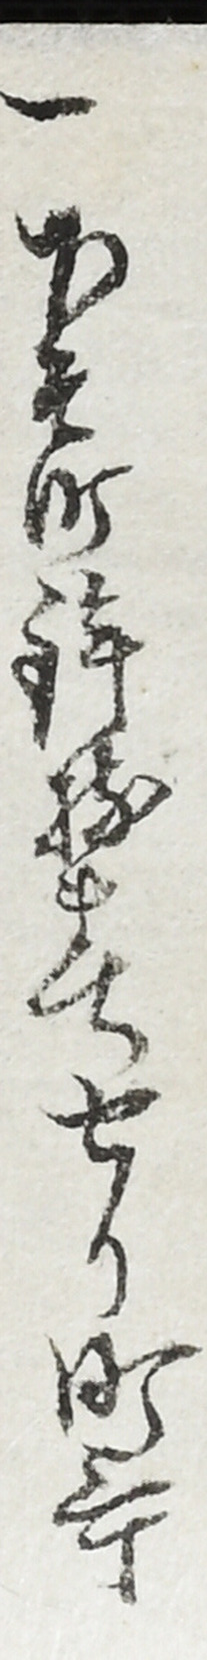一下モ町鉾持まち七り町三丁
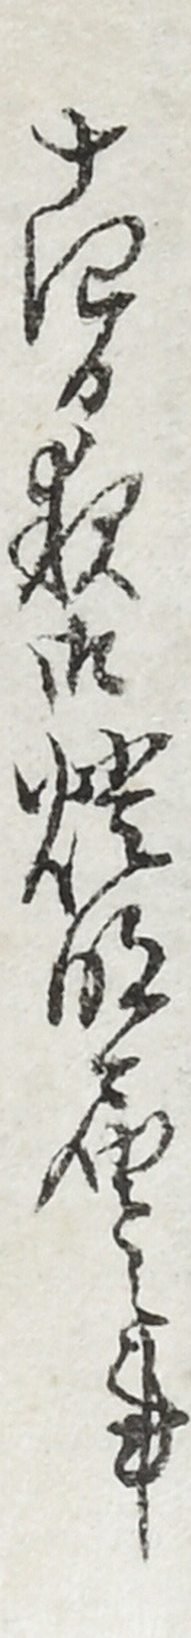十四日夜御燈明届之事
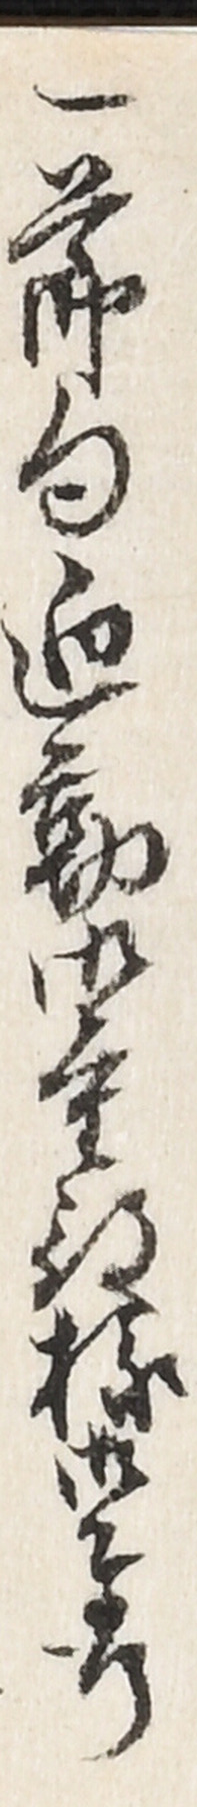一節句近勤御重役様御奉行
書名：年内行事懐中録
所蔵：伊那市立高遠町図書館・合同会社AMANE
